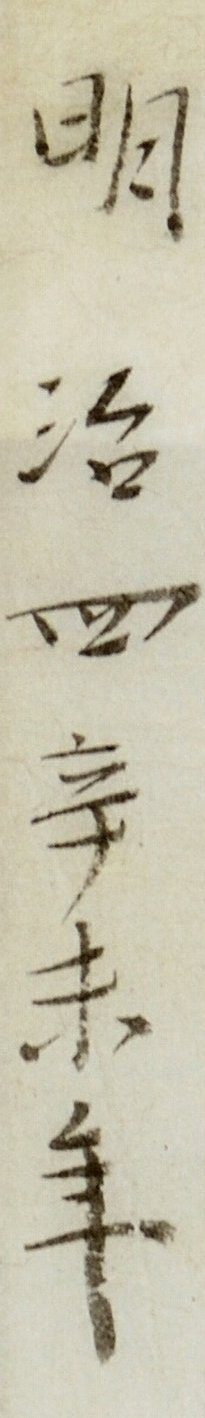明治四辛未年
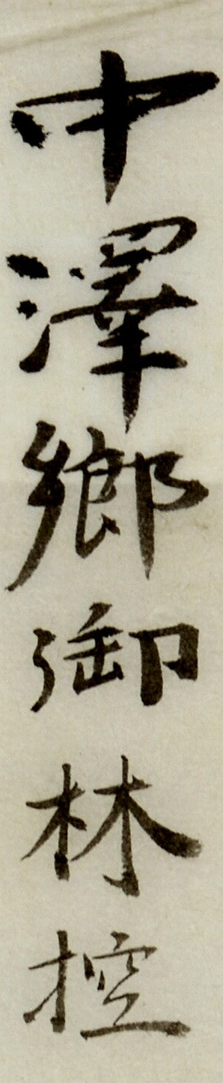中澤郷御林控
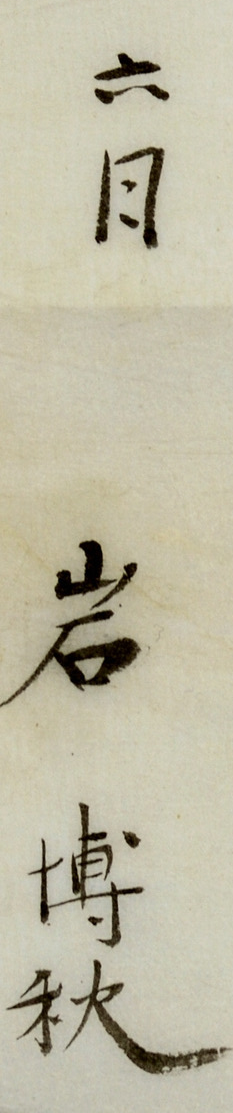六月岩博秋

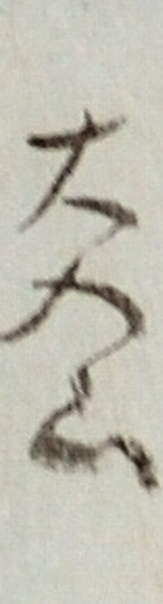右入山
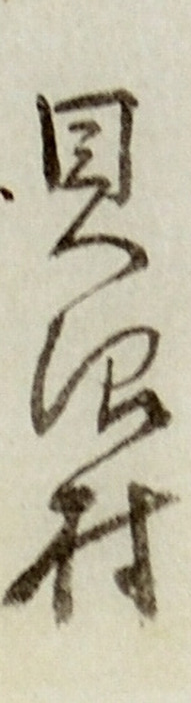貝沼村
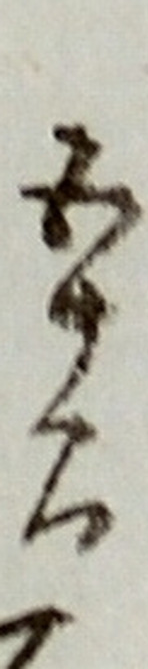四十間
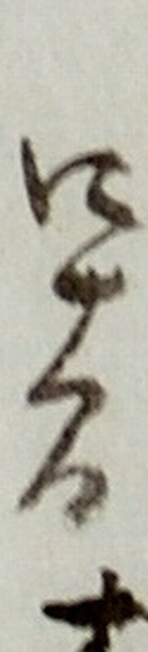四十間
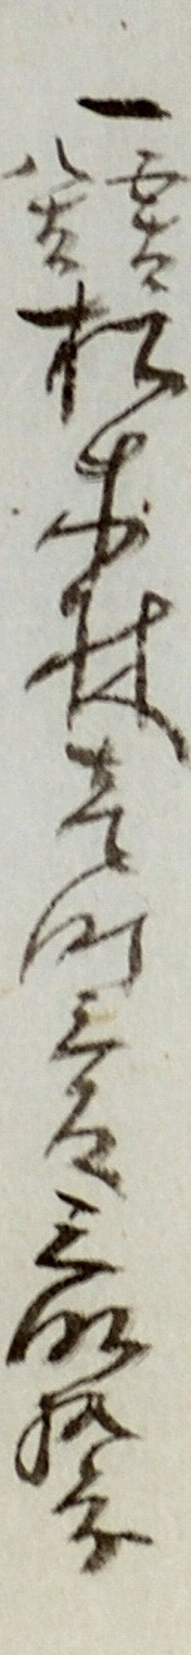一五十間松木林壱町三反三畝拾歩
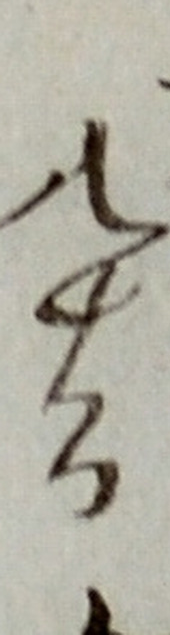八十間
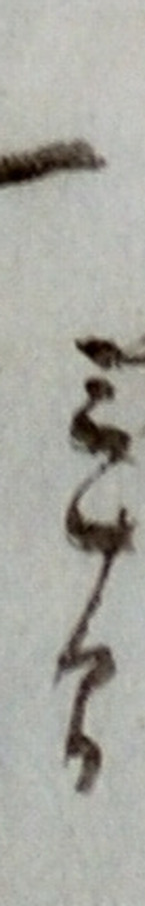一六十間
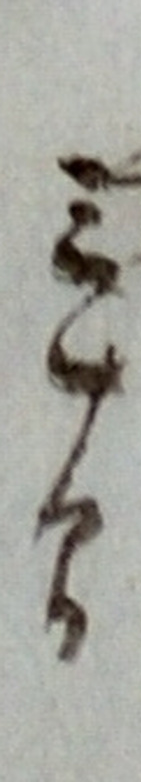四十間

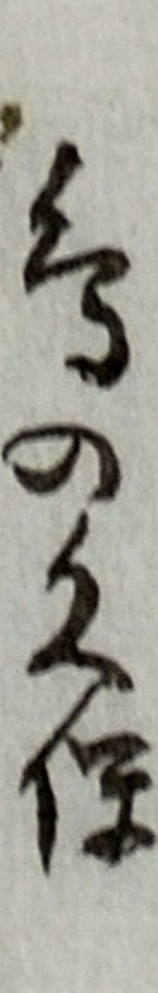鳥の久保
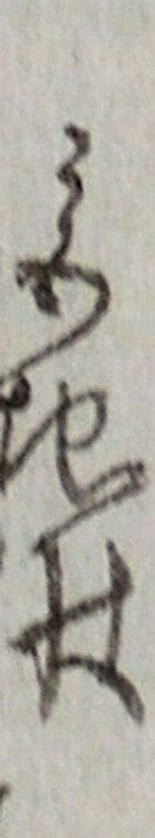宮地杜
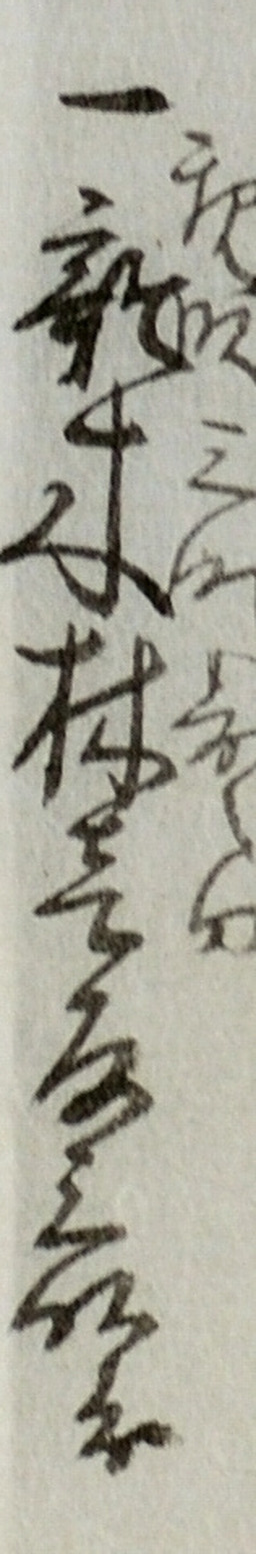一雑木林壱反三畝歩十
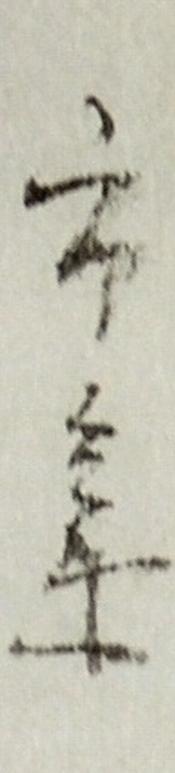与兵衛
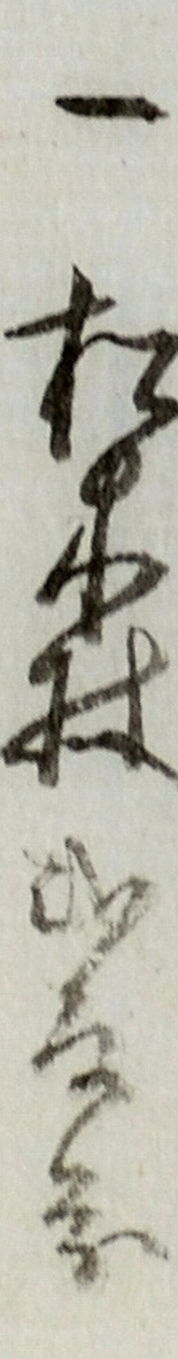一松木林弐反歩
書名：中澤郷御林控
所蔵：伊那市立高遠町図書館・合同会社AMANE
